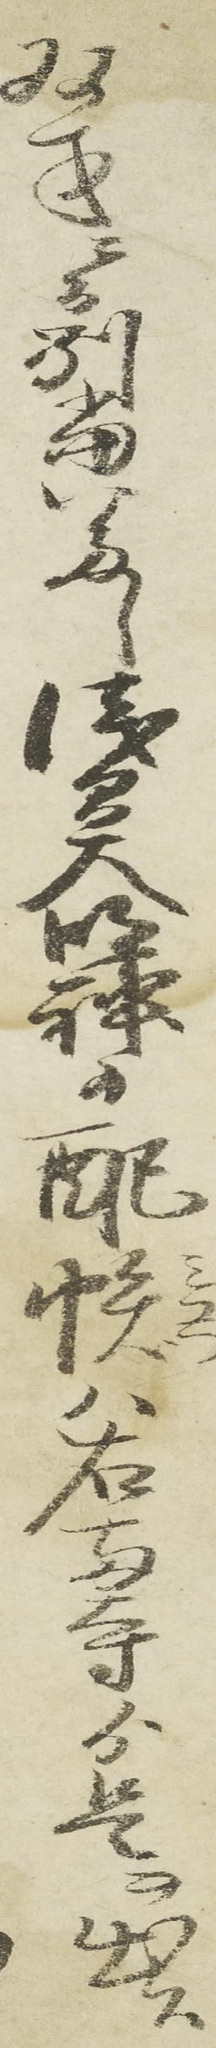双方ニ而別当いたし浅間大明神の配帙ハ右両寺ゟ是ヲ出ス
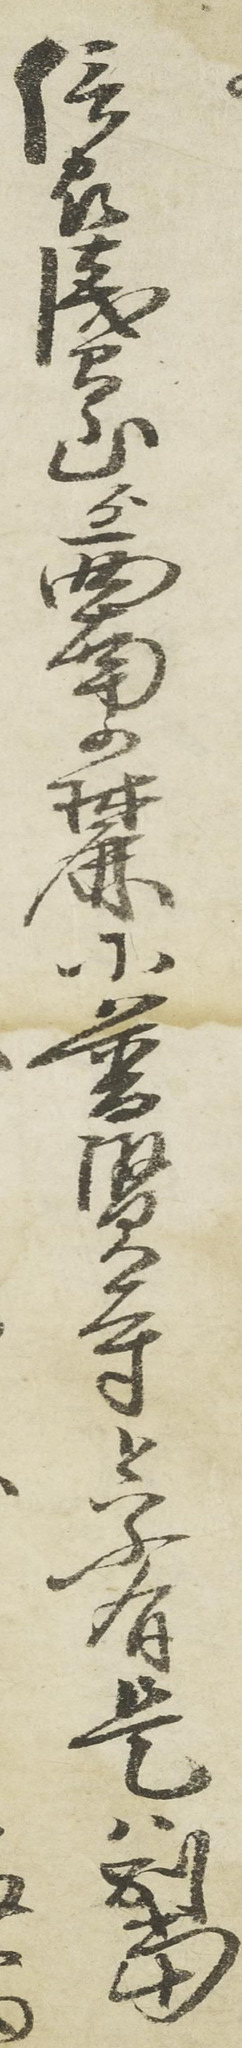一信州浅間山ゟ西南の麓ニ普習公寺といふ有是ハ別当
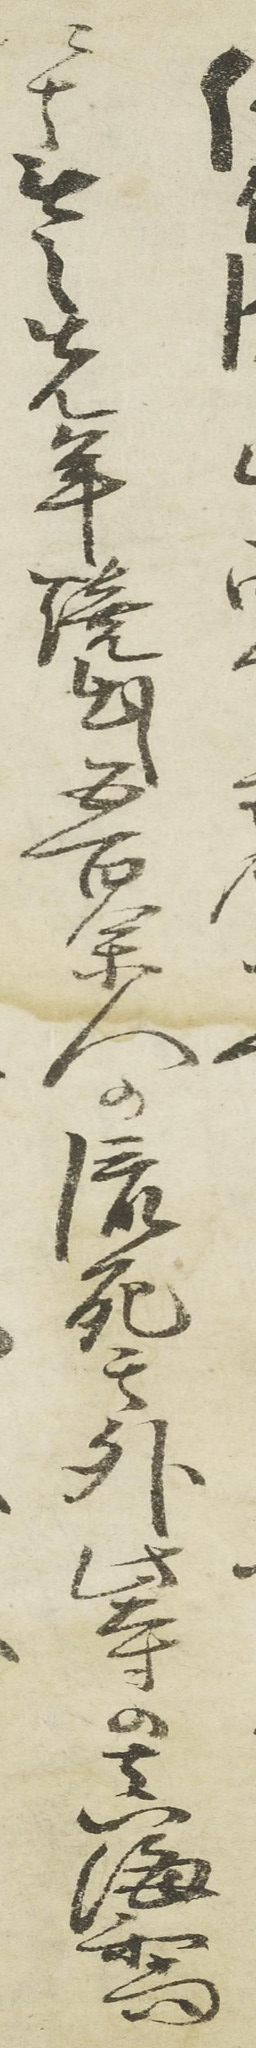ニは無之先年焼出五百余人の流死其外此寺の真海和尚
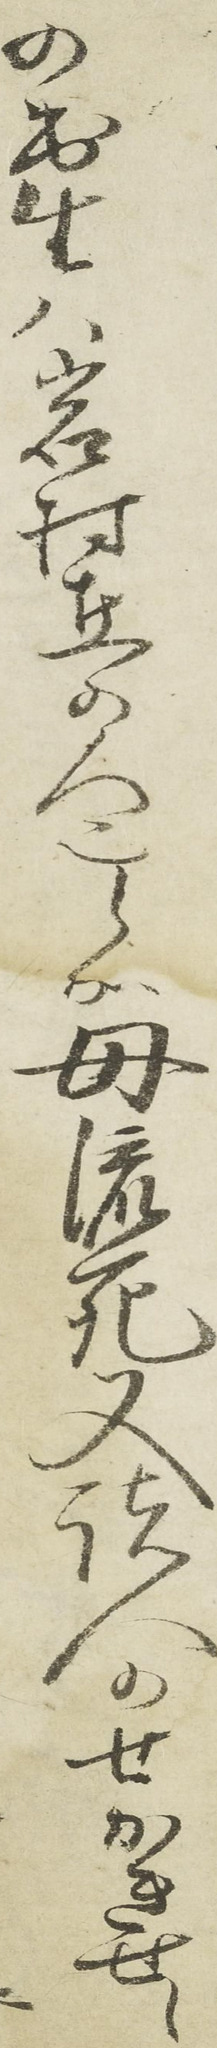の出生ハ岩村在の人也しか母流死又諸人のせかきせし
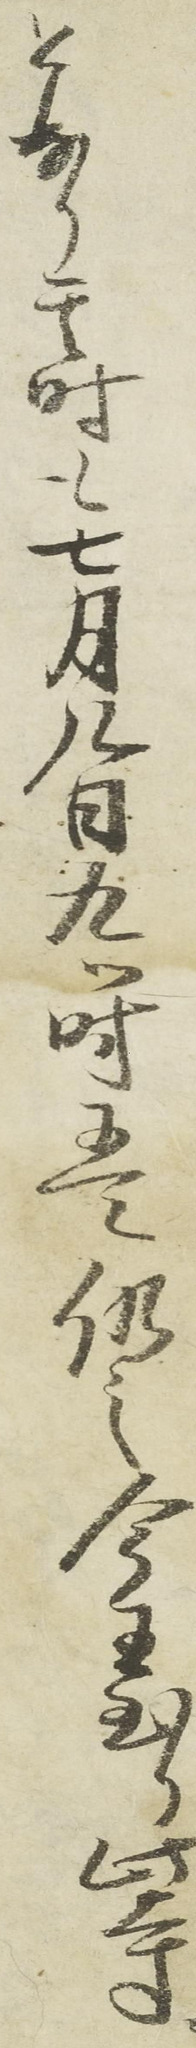となり其時も七月八日九ツ時にて仍之今に至り此寺ニ
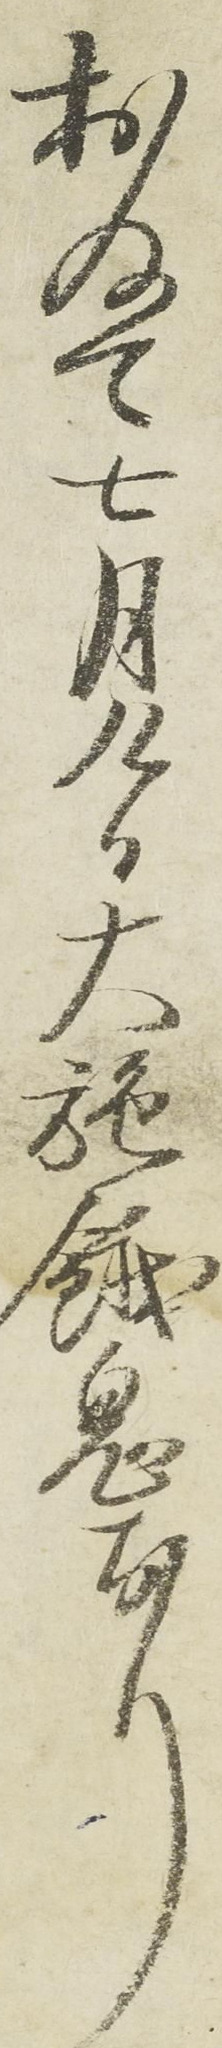おいて七月八日大施餓鬼なり
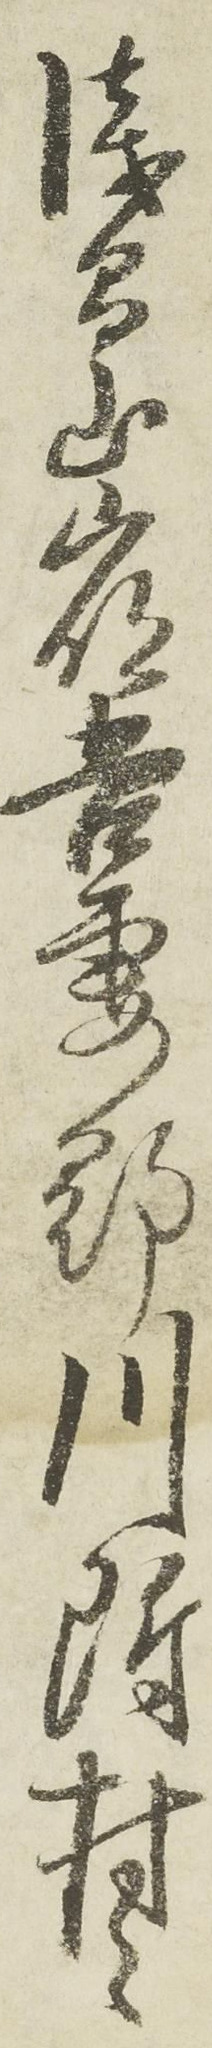浅間山岸吾妻郡川附村々
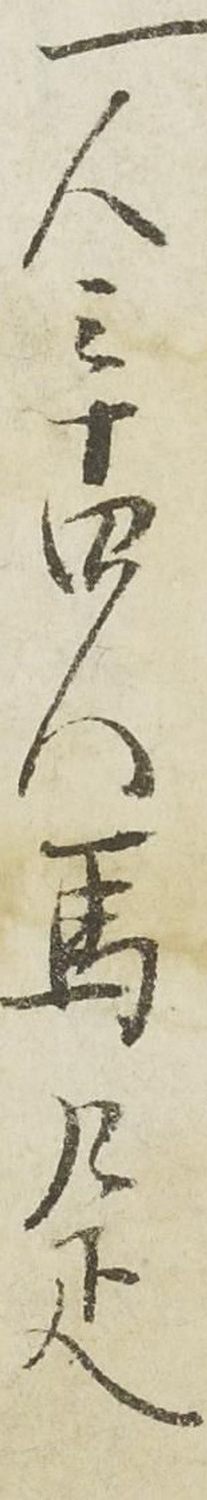人三十四人馬八疋
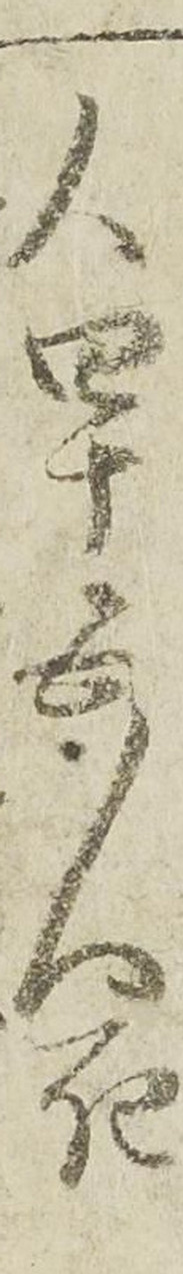人四十五人死
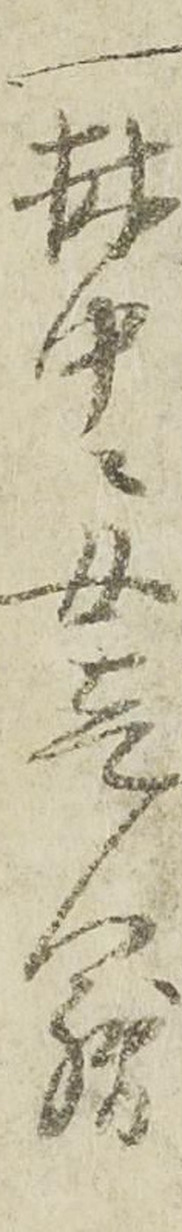林中に廿壱人残
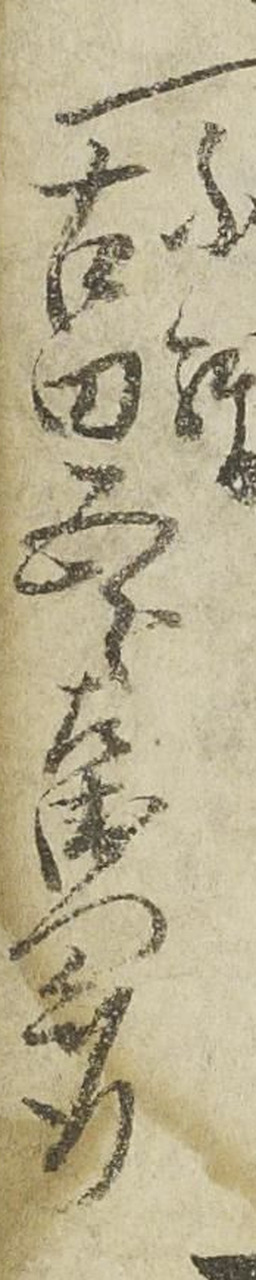古田五郎左衛門知行

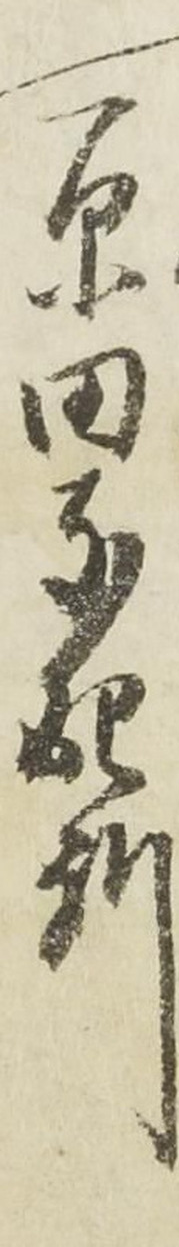原田支配所
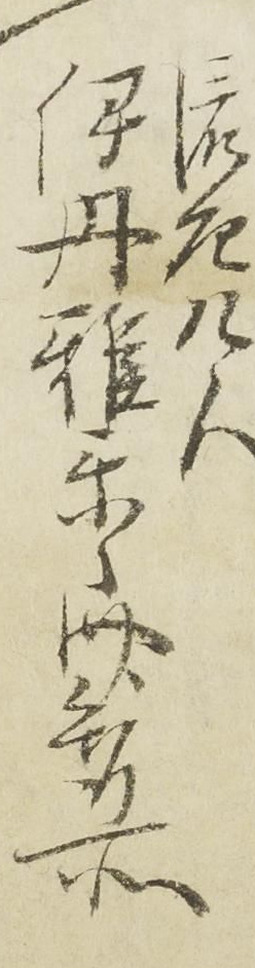伊丹雅楽之助人拾人
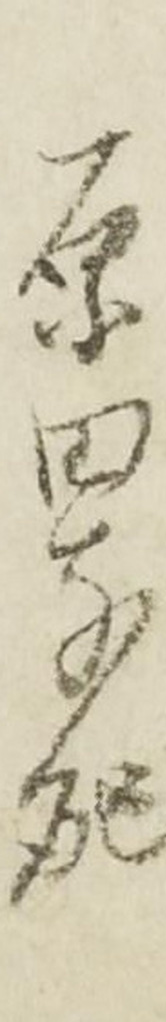原田支配
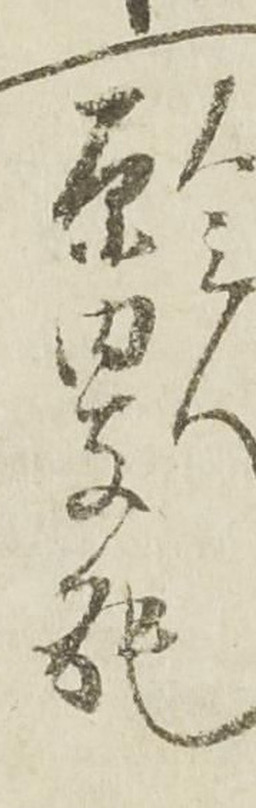原田支配
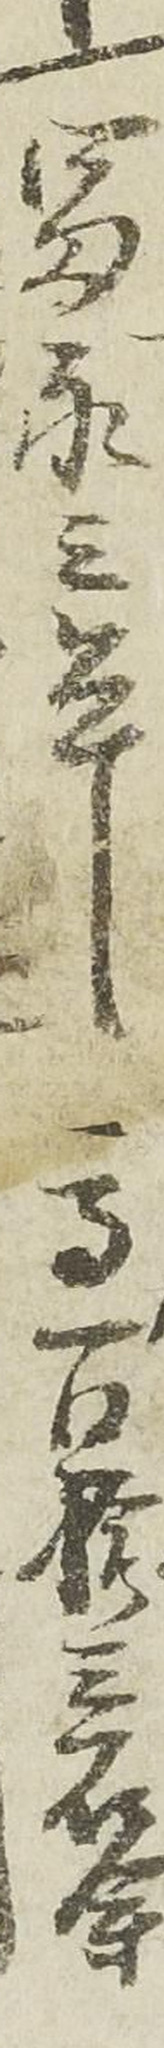富永三平高百拾三石余
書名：浅間大変略記
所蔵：東京大学地震研究所図書室 Earthquake Research Institute Library, The University of Tokyo, JAPAN
